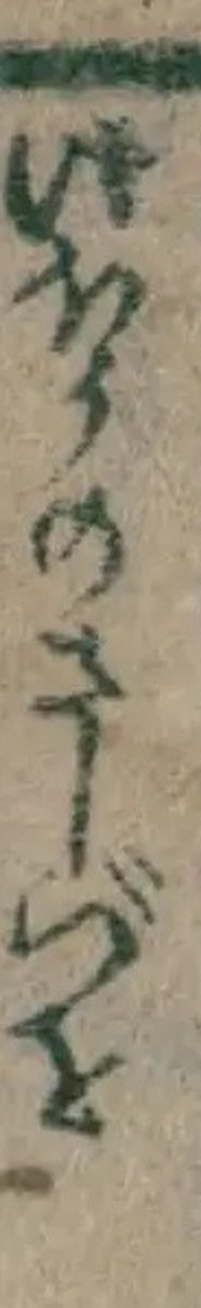此ほうのさしづを
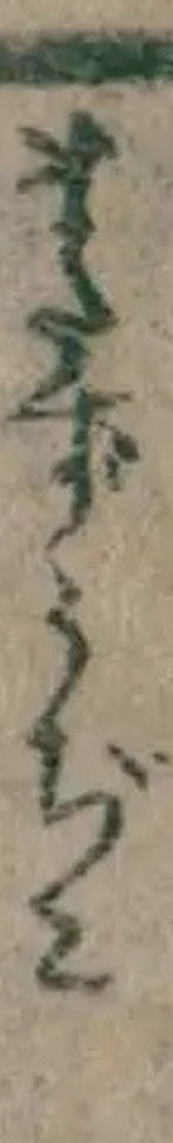またずうじこ
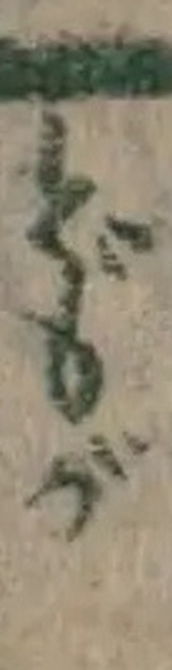どもが
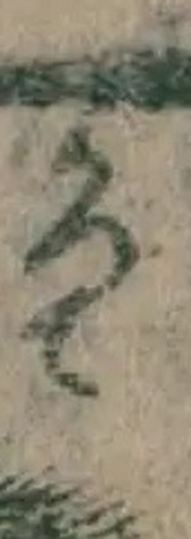かつて
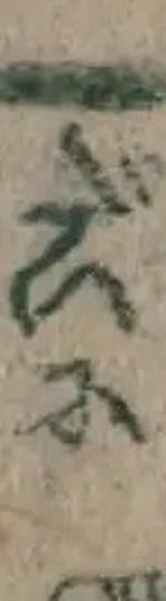だいに
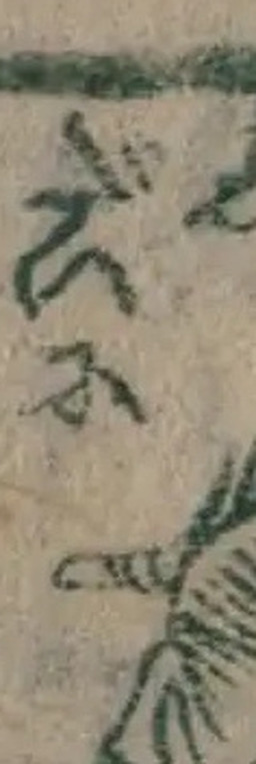だいに
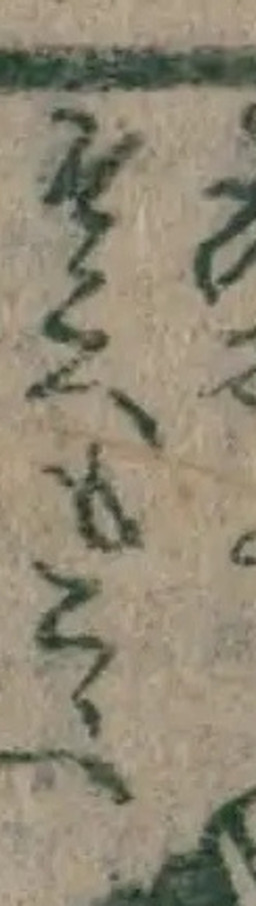そこへもこゝへ
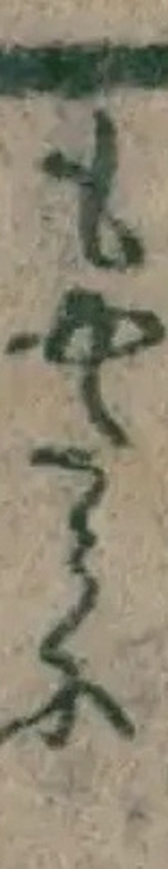もやたらに
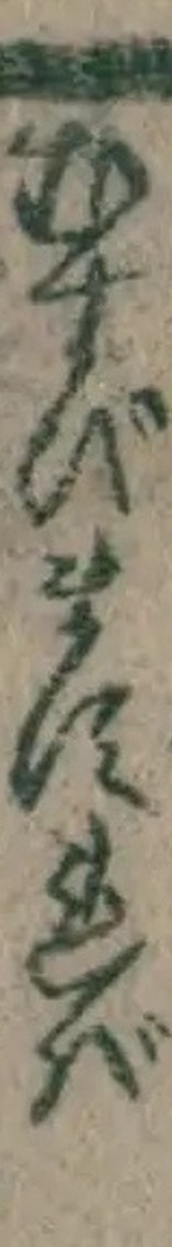むすびますれば
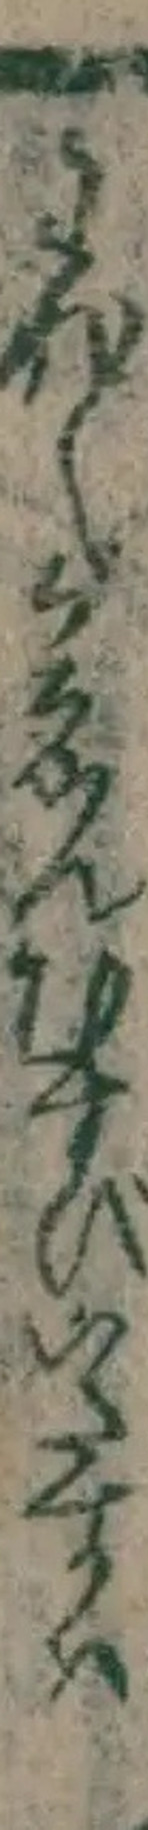われ〳〵がえんむすびいたすは
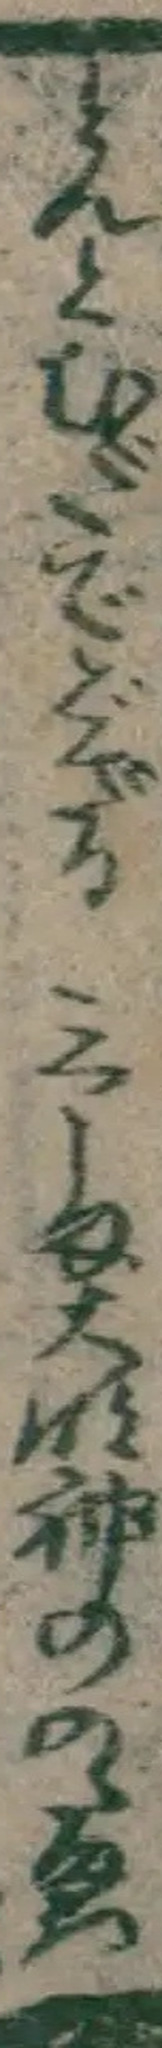とんとむだでござる三しま大明神ののたまはく
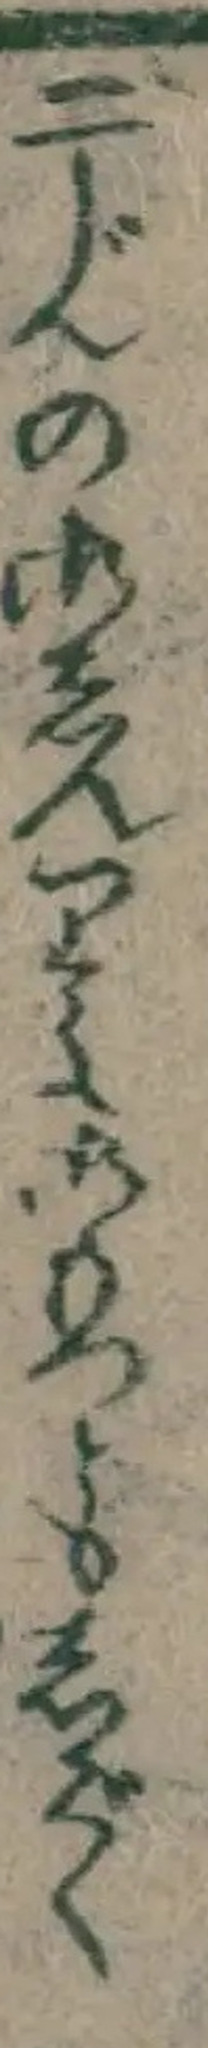二じんの御しんりよ御もつともしごく
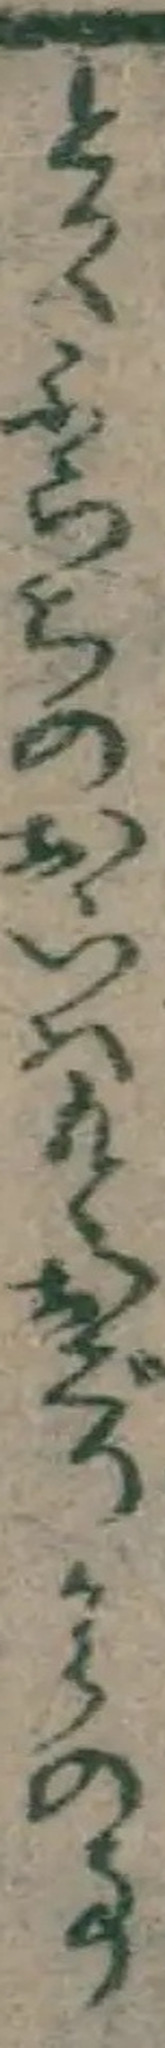とかくふらちのおゝいはもとおごりからの事
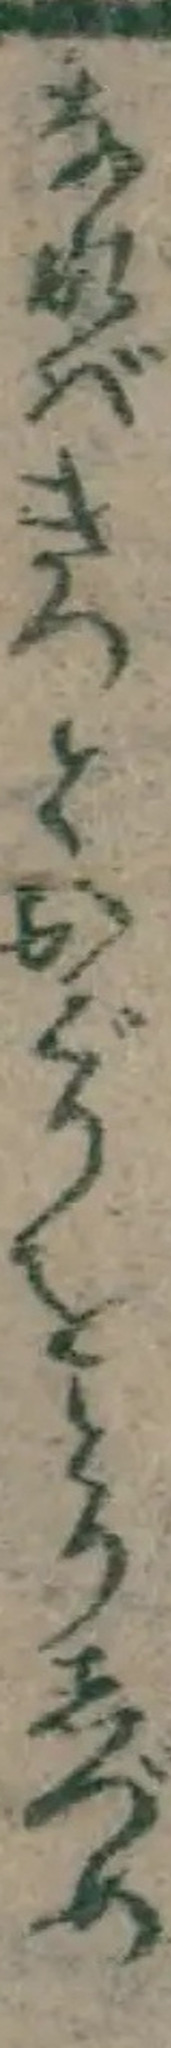なればきつとおごりをとりしづめ
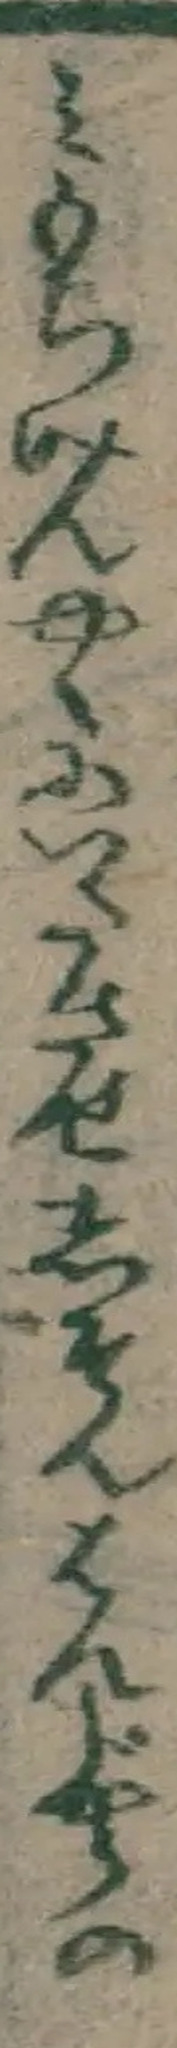みもちけんやくにいたさせしそんはんじやうの
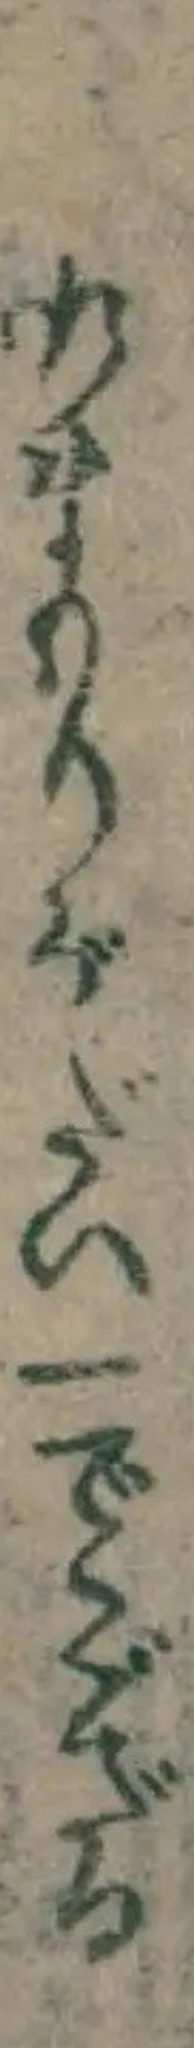御まもりがだい一でござる
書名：頓作時雨月 3巻
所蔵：国立国会図書館 National Diet Library, JAPAN
